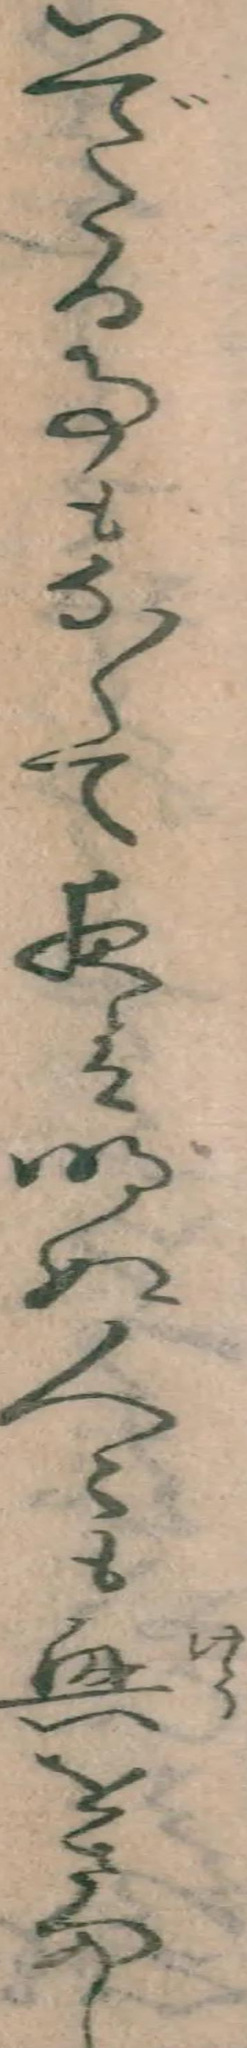いでたる事もなくて夜は明ぬ人々も興をさまし
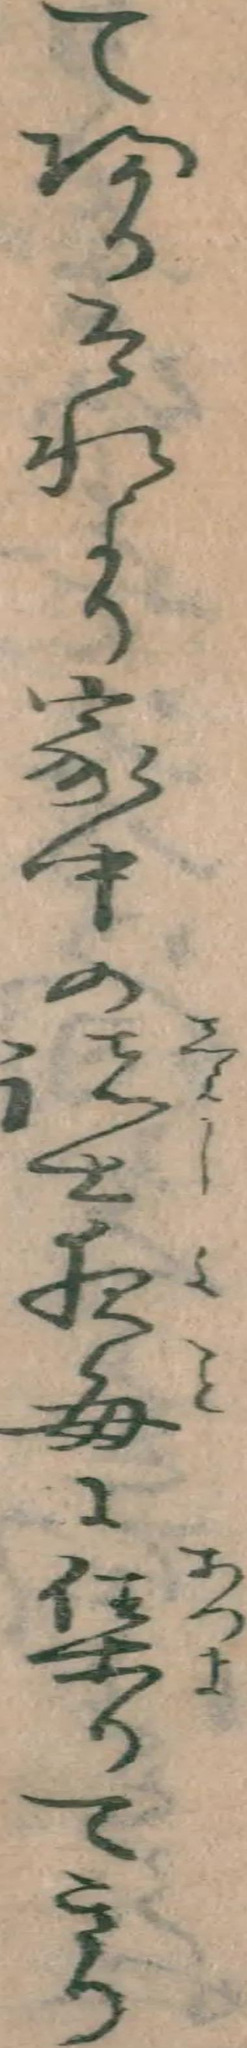て帰りそれより家中の諸士毎夜に集りてきり
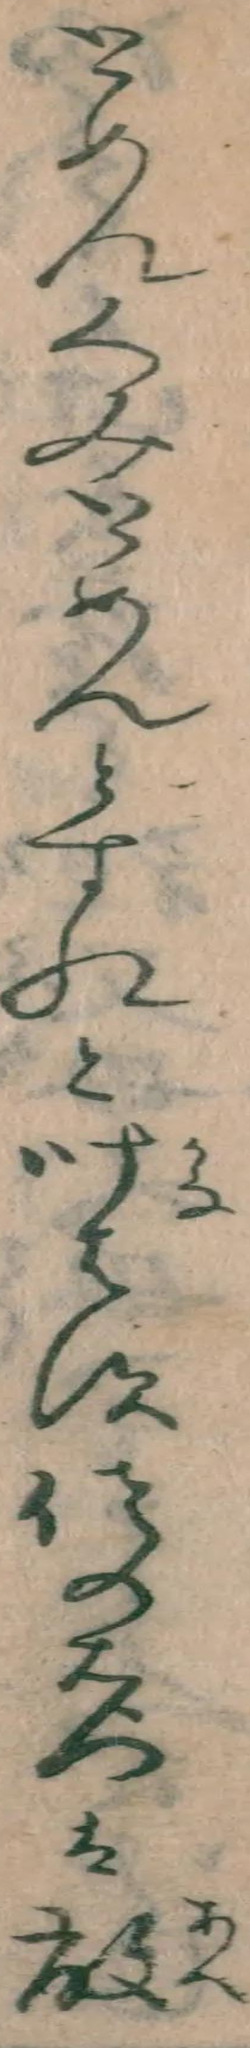とめんくみとめんとすれと叶はす佐の右衛門敢
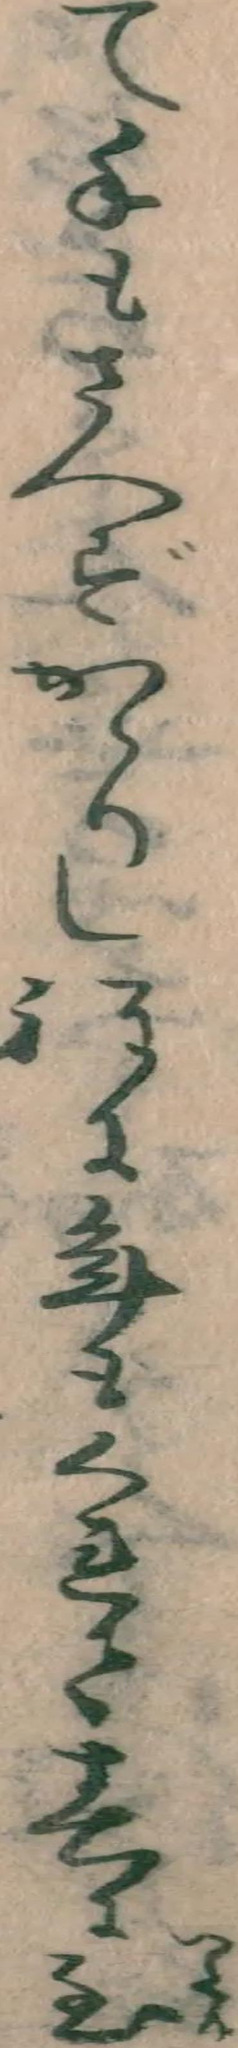て手もさへずかゝりし程に年もくれて春に至
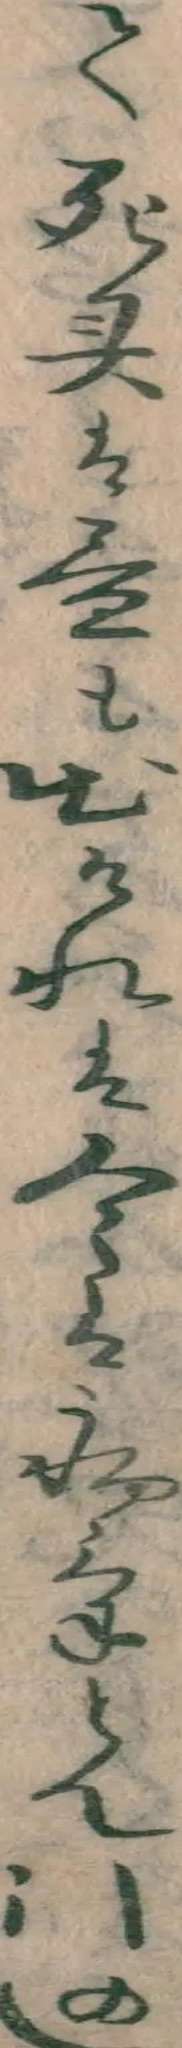て死霊は昼も出けれは今は病気とて引込
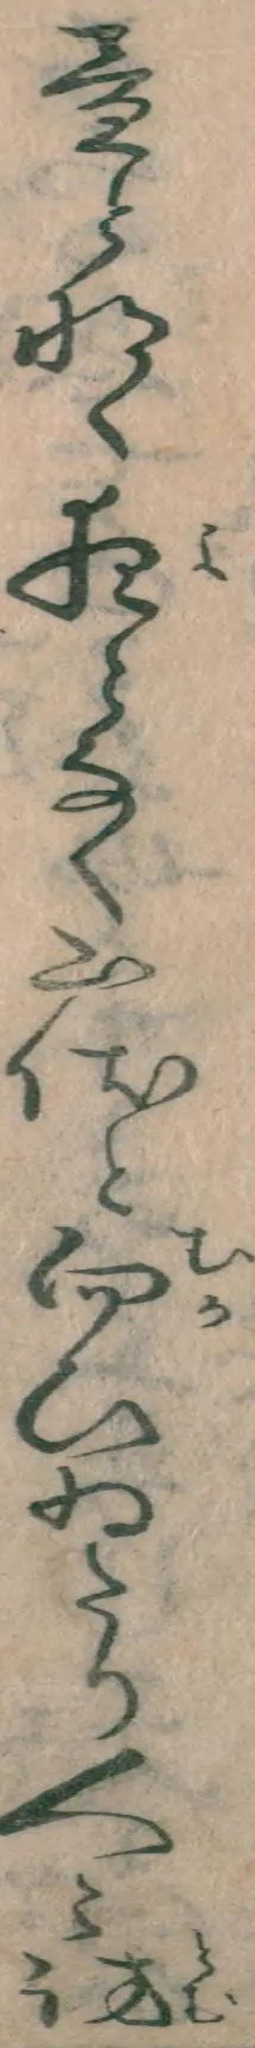昼となく夜となく山伏と向ひゐたり人々訪
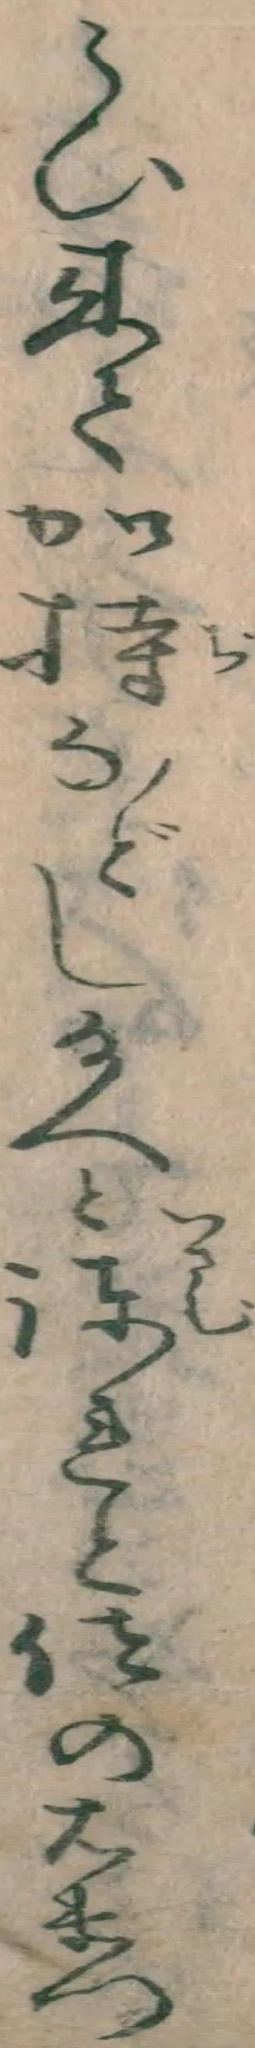らひ来て加持などし給へと諌れと佐の右衛門
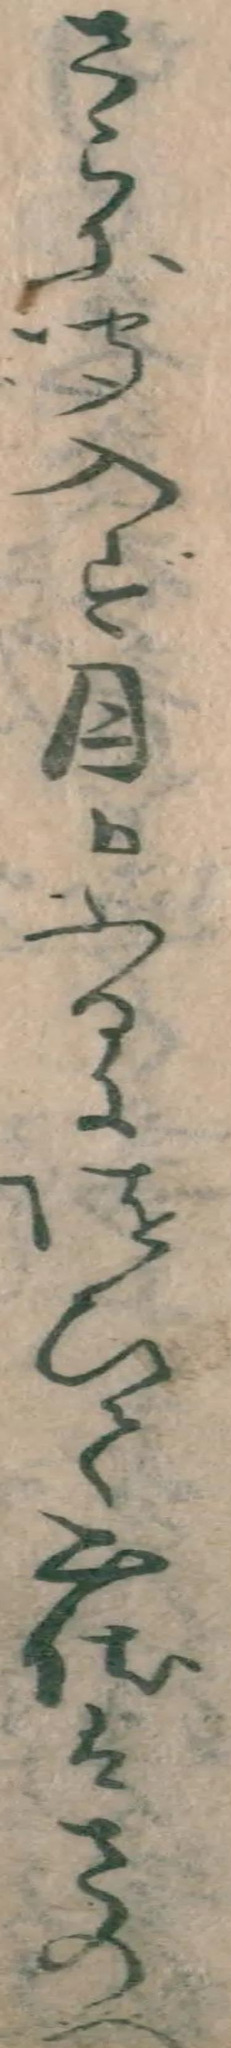さらに聞入ず月日ふるに随ひて山伏はさのへ
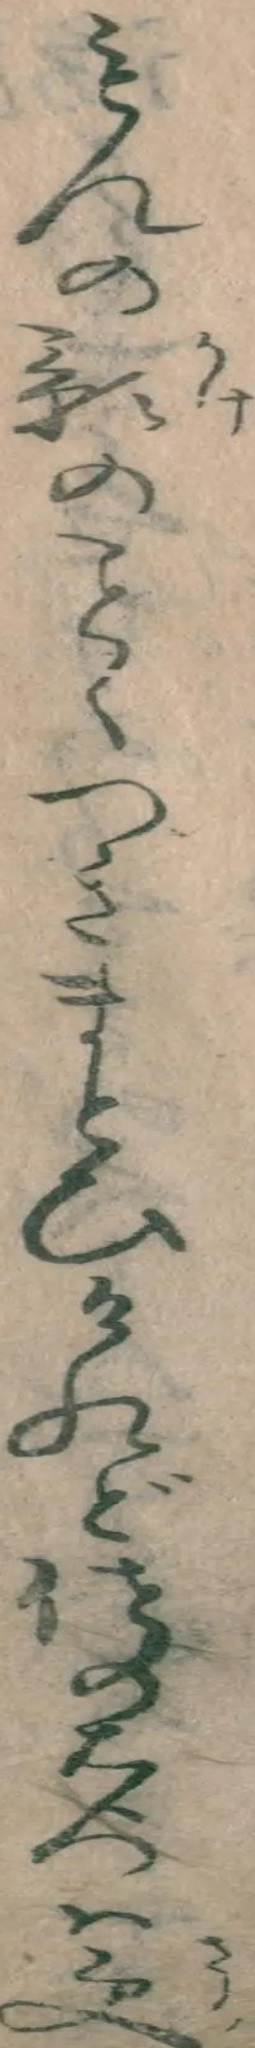もんの影のことくつきまとひけれど佐の右衛門は更
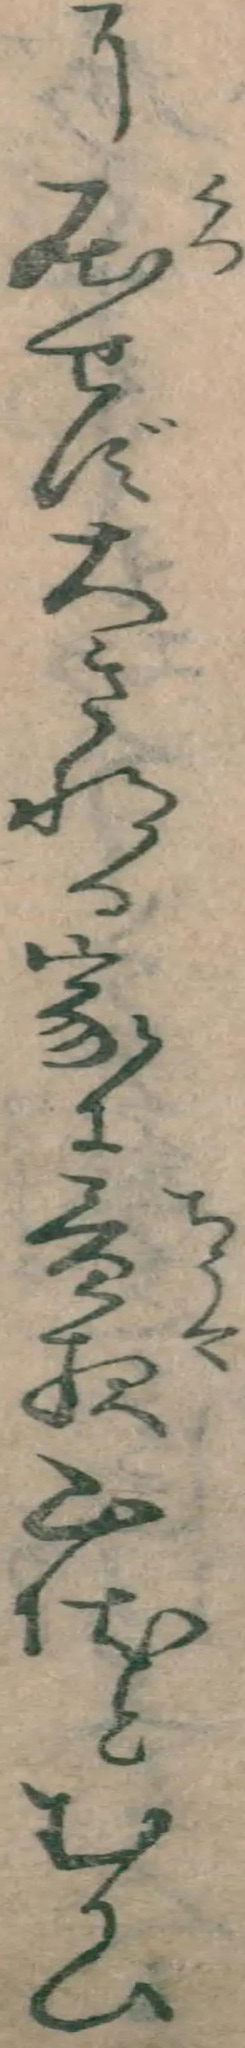に屈せず大きなる家に昼夜山伏とむかひ

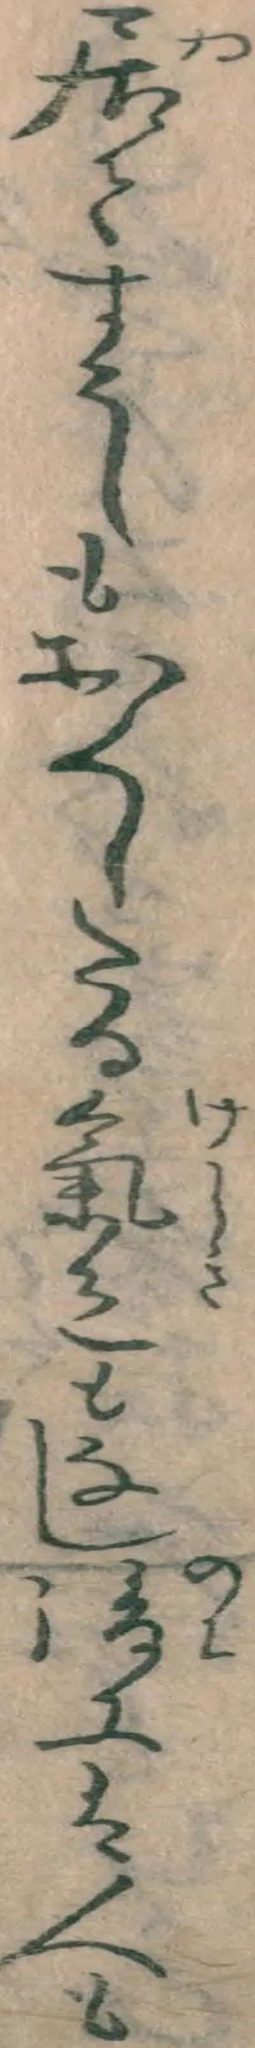居てすこしもおくしたる気色もなし後には人も
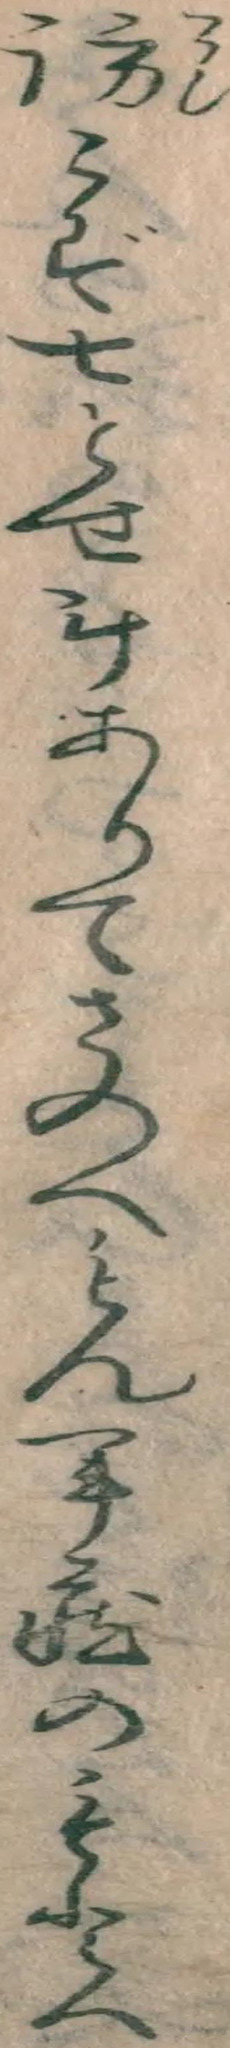訪こず七とせ斗ありてさのへもん軍蔵のもとへ
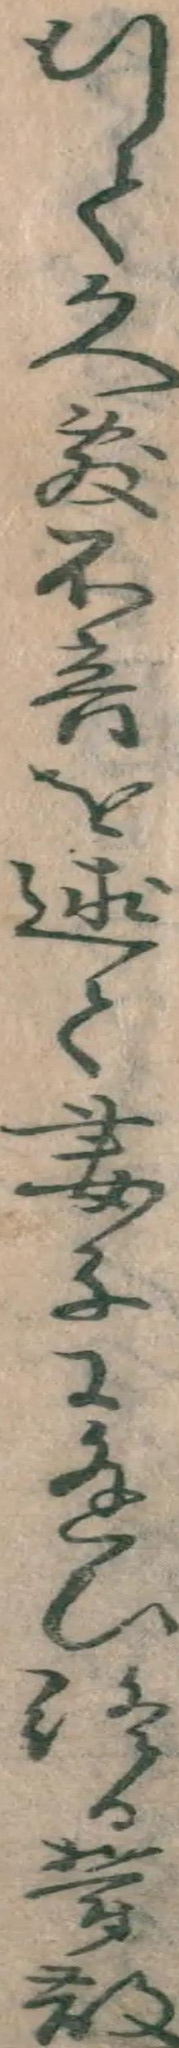行て久敷不音を述て妻子に逢ひ終日鬱散
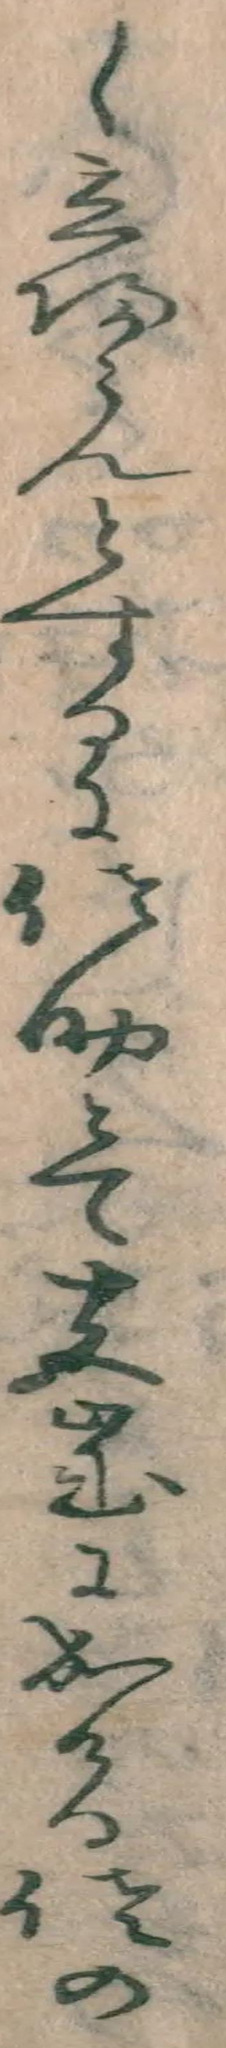し立帰らんとするに佐助とて十五歳に成ける佐の
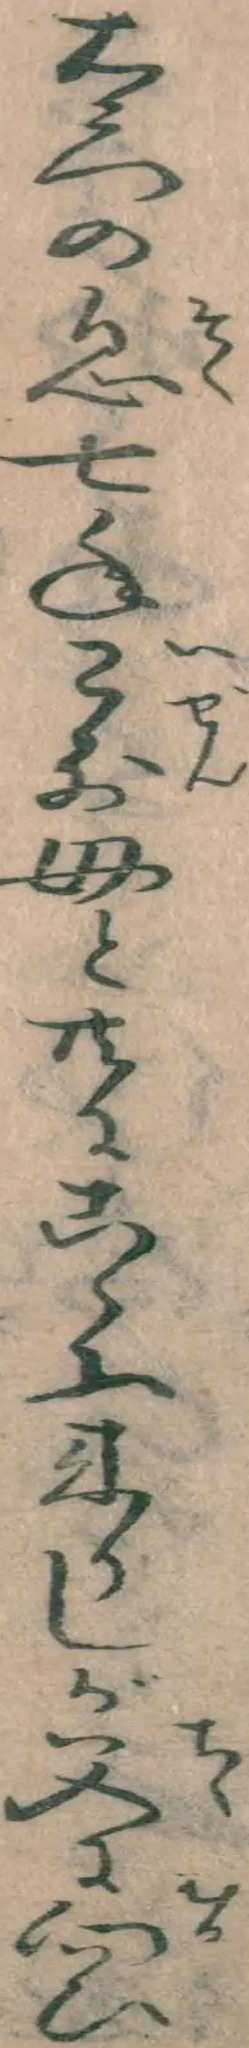右衛門の息七年已然母と共にこゝに来りしが父に向ひ
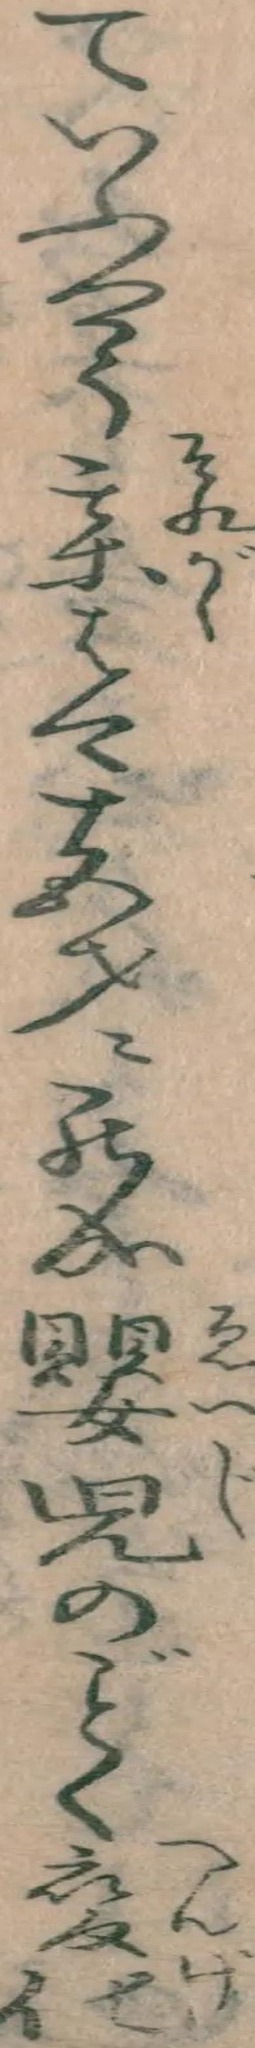ていふやう某はや十五才に罷成嬰児のごとく変化
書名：怪談御伽童 5巻. [2]
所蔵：国立国会図書館 National Diet Library, JAPAN
